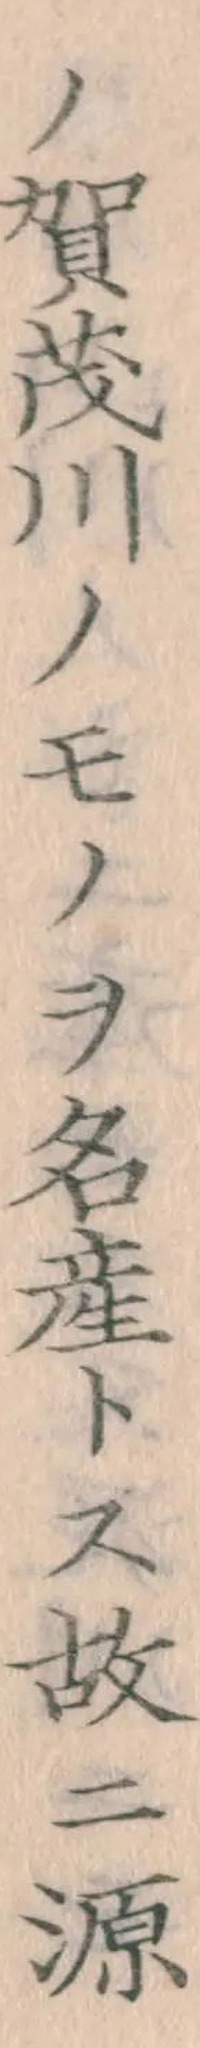ノ賀茂川ノモノヲ名産トス故ニ源
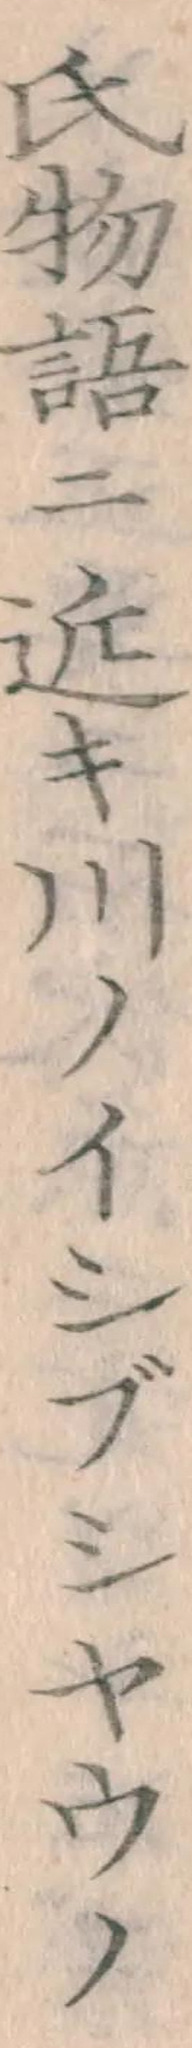氏物語ニ近キ川ノイシブシヤウノ
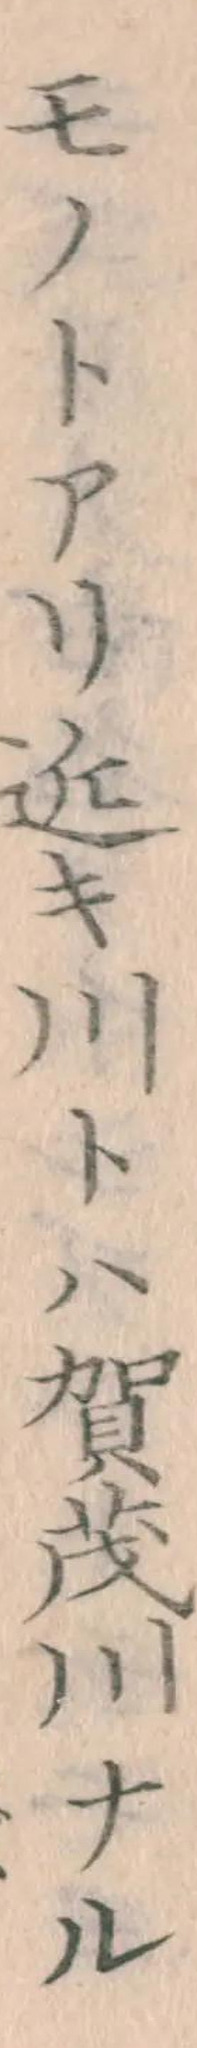モノトアリ近キ川トハ賀茂川ナル
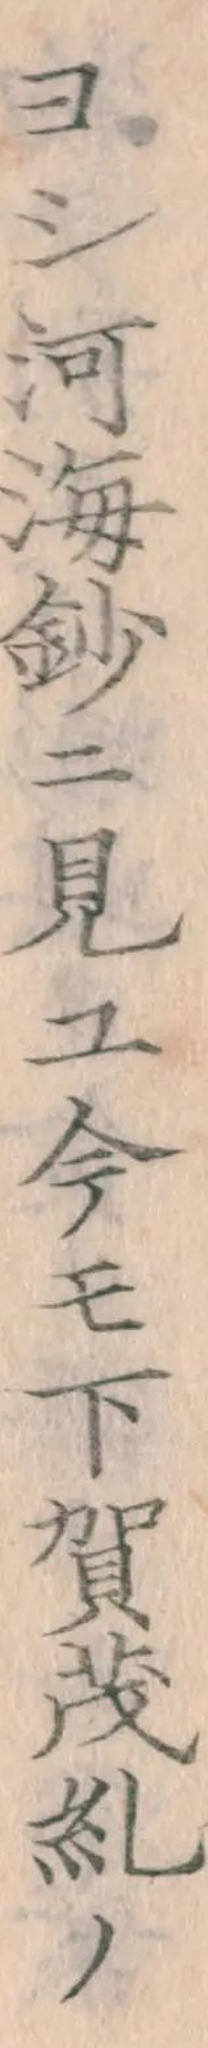ヨシ河海鈔ニ見ユ今モ下賀茂糺ノ
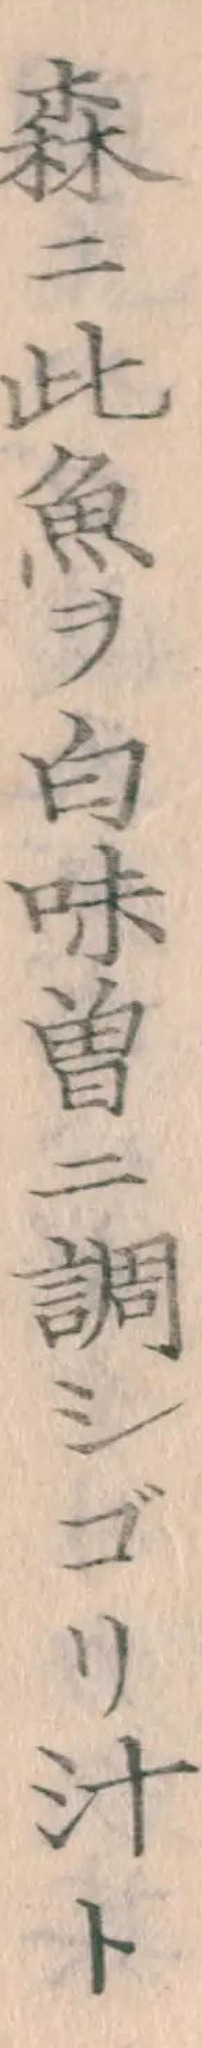森ニ此魚ヲ白味噌ニ調シゴリ汁ト
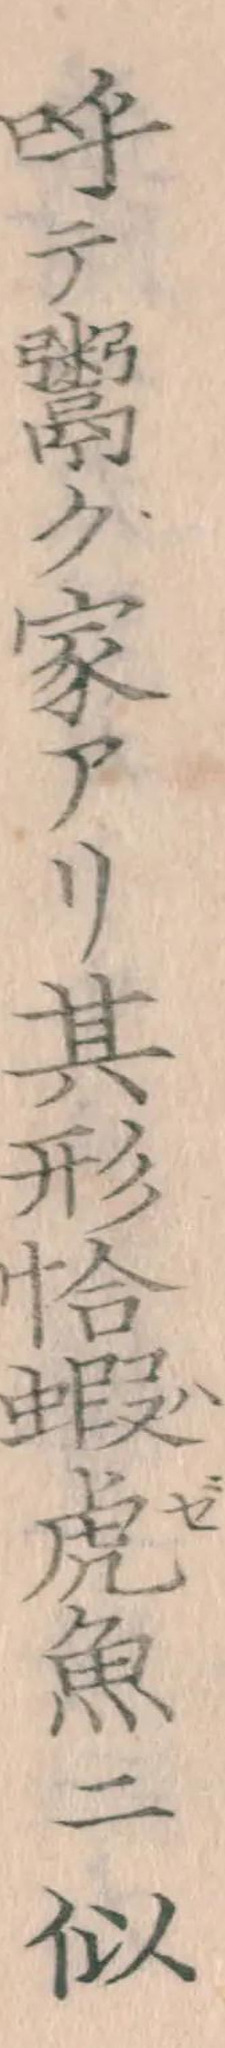呼テ鬻ク家アリ其形恰蝦虎魚ニ似
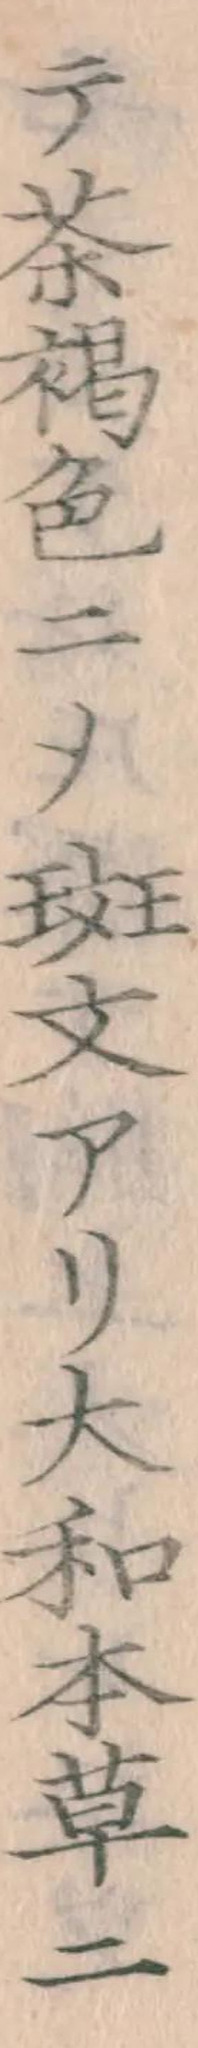テ茶褐色ニシテ斑文アリ大和本草ニ
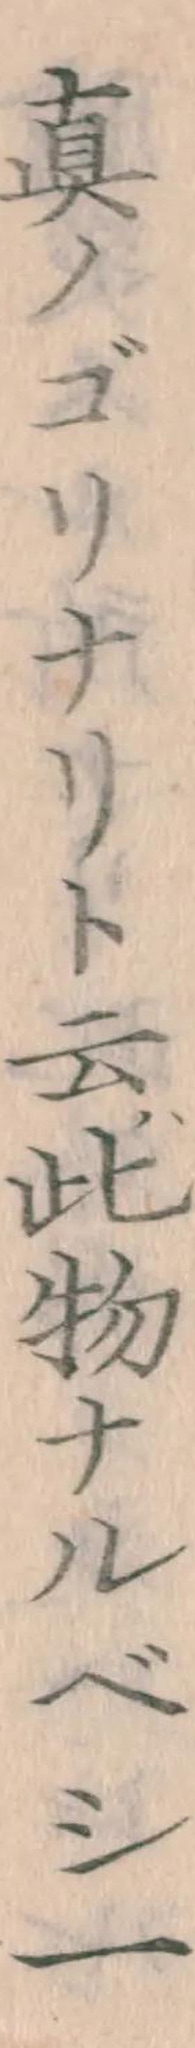真ノゴリナリト云此物ナルベシ一
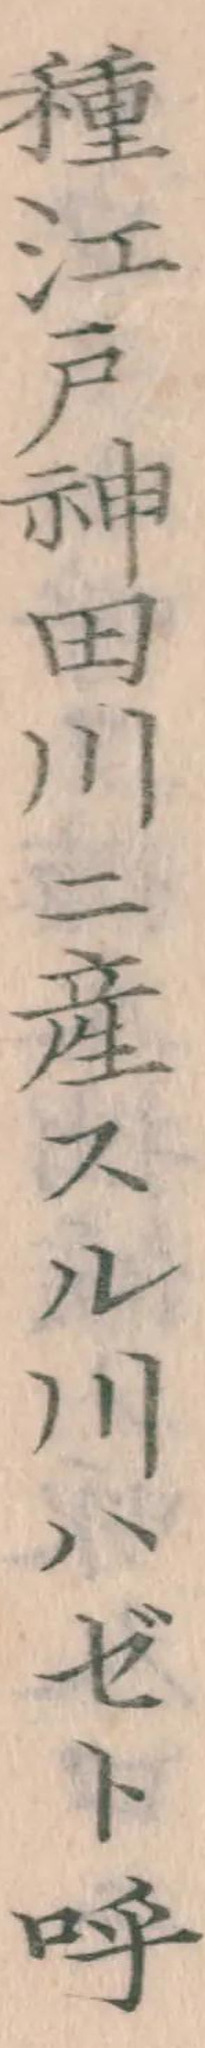種江戸神田川ニ産スル川ハゼト呼
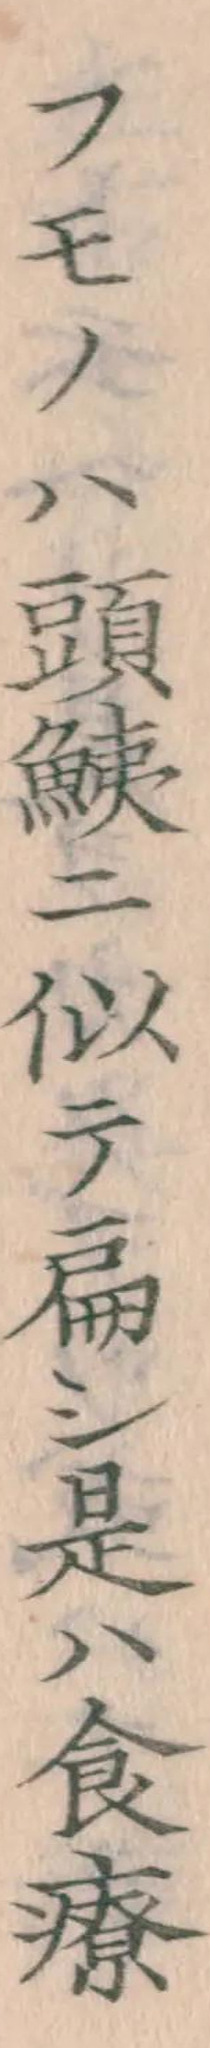フモノハ頭鮧ニ似テ扁シ是ハ食療
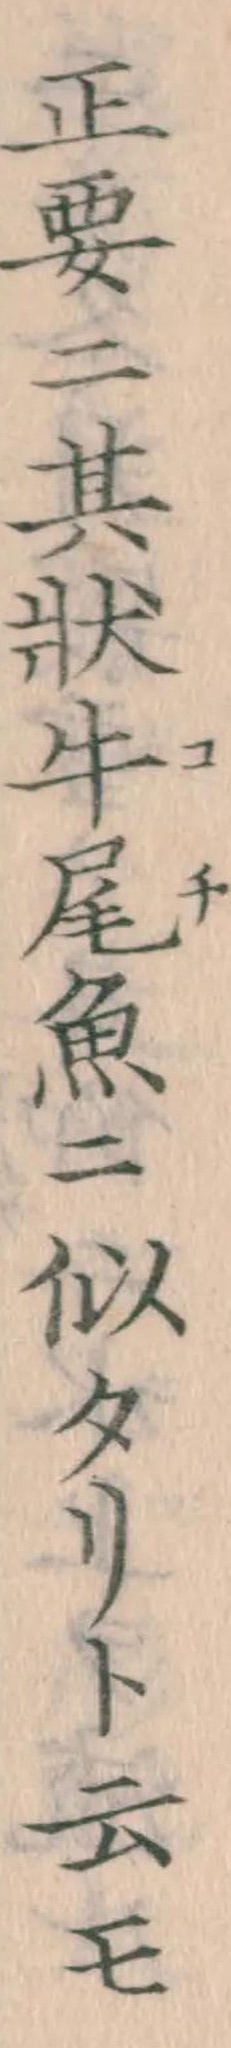正要ニ其状牛尾魚ニ似タリト云モ
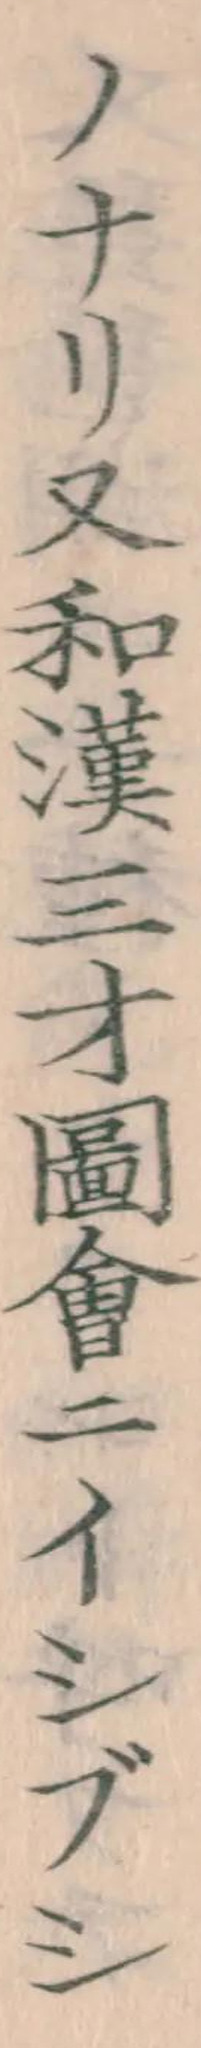ノナリ又和漢三才図会ニイシブシ
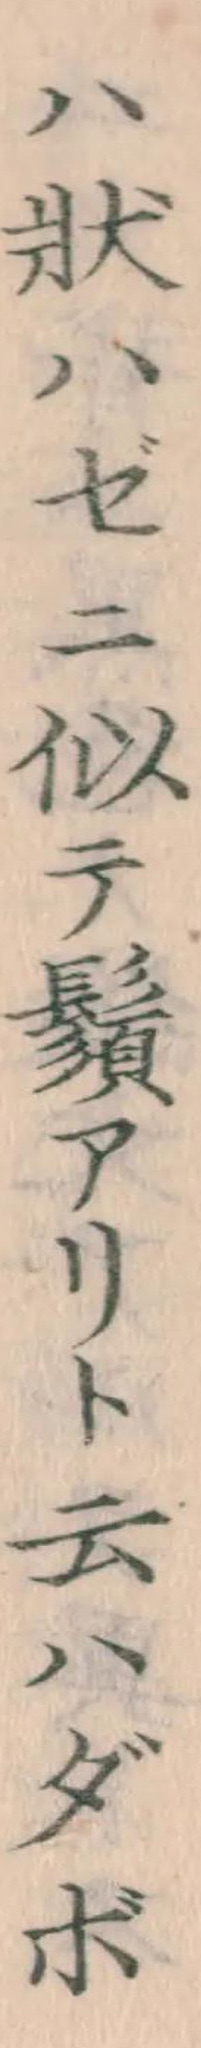ハ状ハゼニ似テ鬚アリト云ハダボ
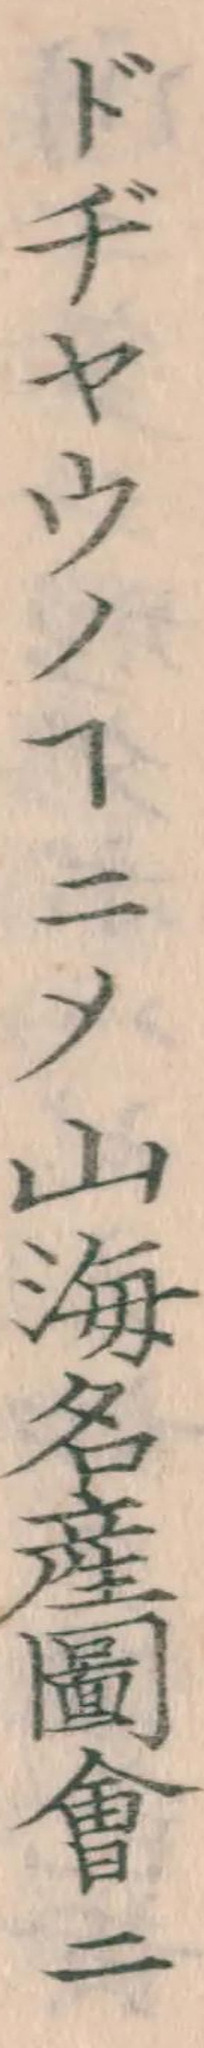ドヂヤウノヿニシテ山海名産図会ニ
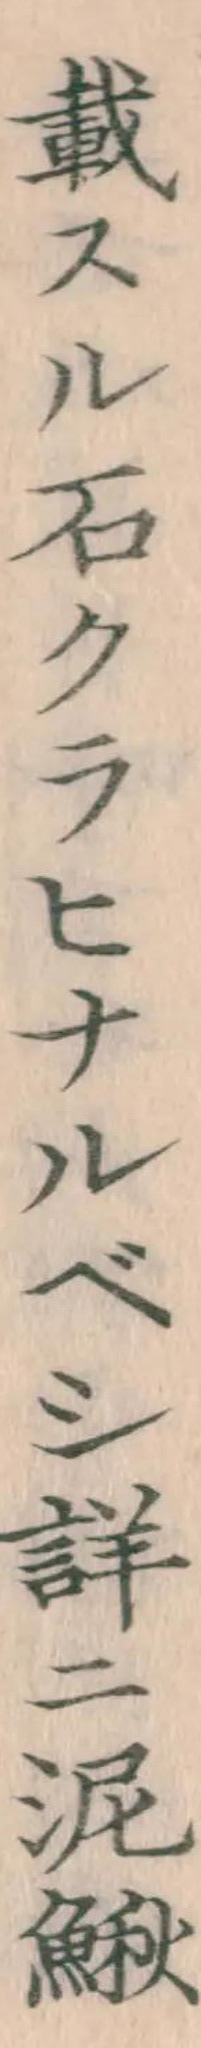載スル石クラヒナルベシ詳ニ泥鰍
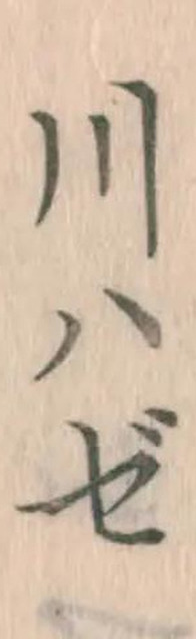川ハゼ
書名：皇和魚譜 2巻
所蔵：国立国会図書館 National Diet Library, JAPAN
